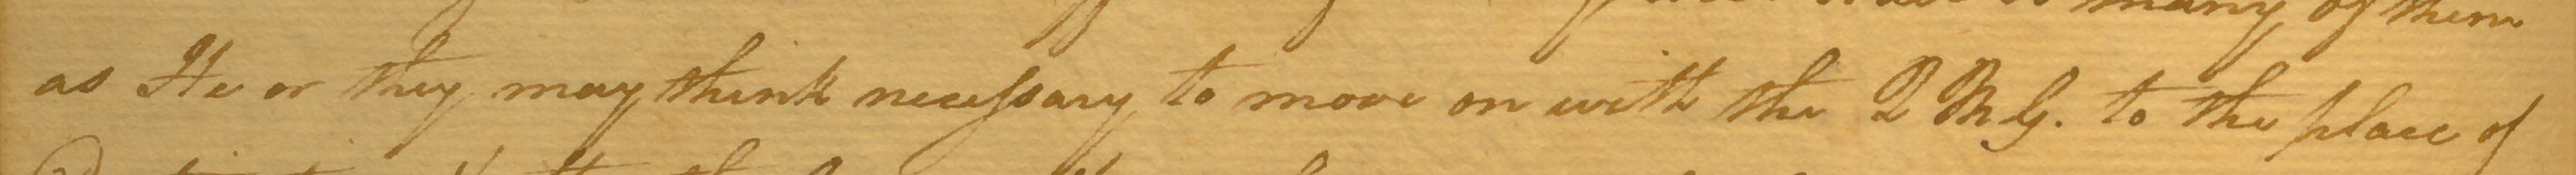as He or they may think necessary to move one with the Q M G. to the place of
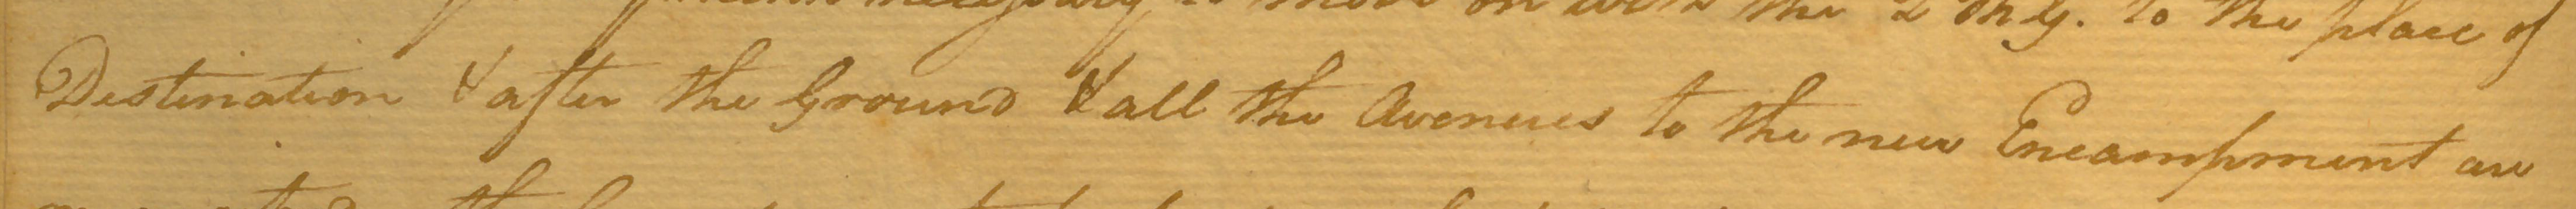Destination & after the Ground & all the Avenues to the new Encampment are
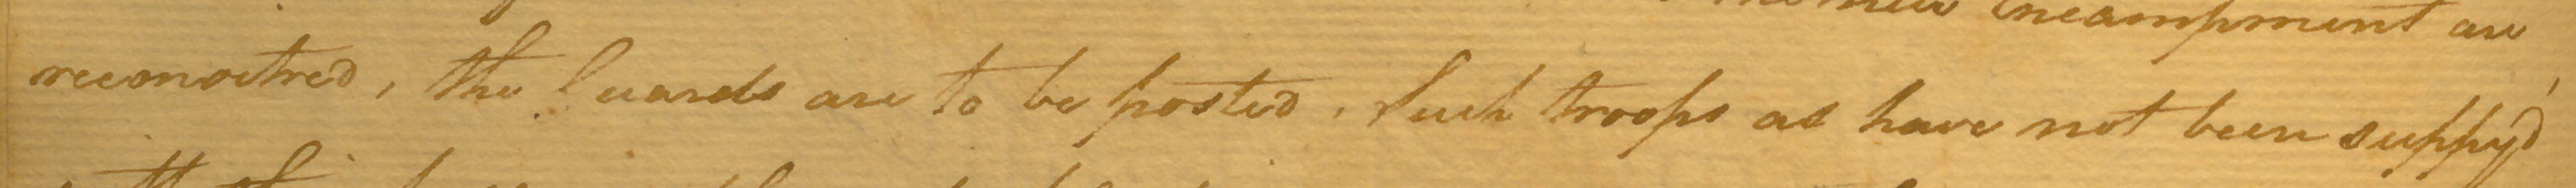reconoitred, the Guards are to be posted. Such troops as have not been supply'd
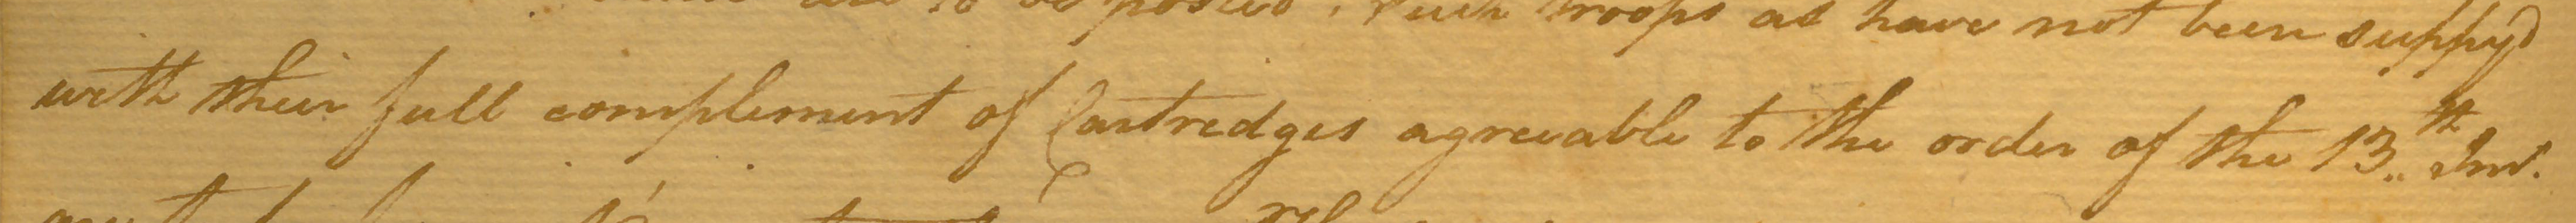with their full complement of Cartridges agreeable to the order of the 13^th Ins^t.
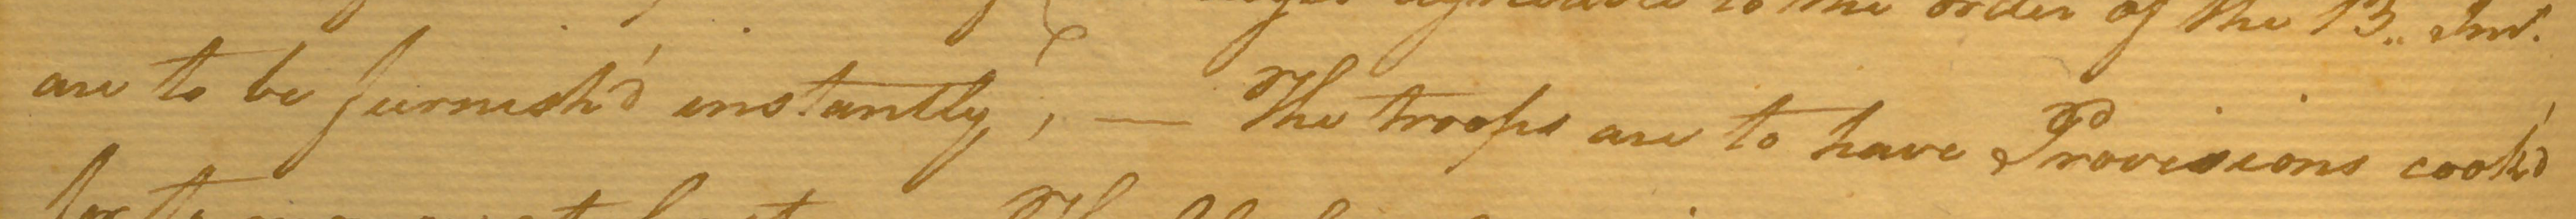are to be furnish'd instantly.- The troops are to have Provisions cook'd
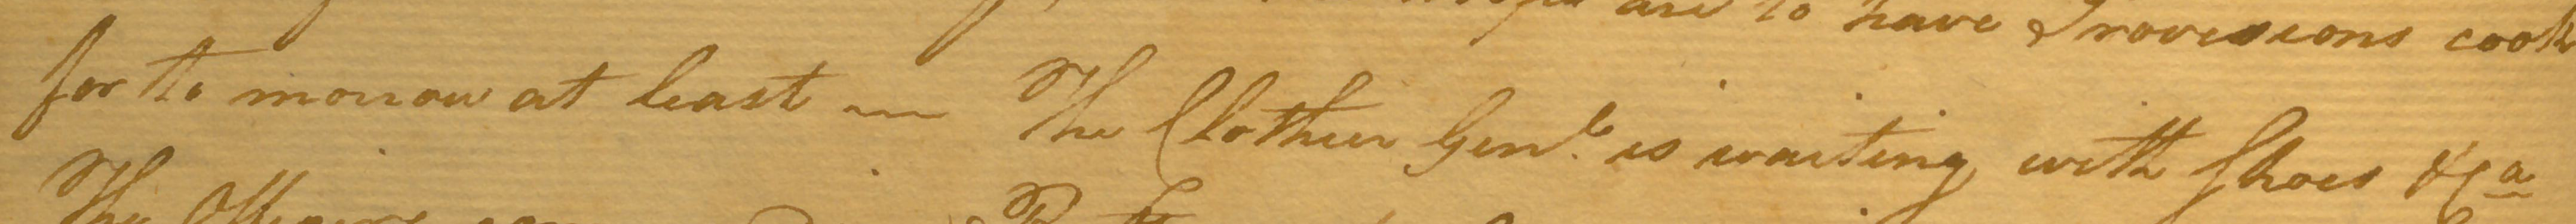or tomorrow at least- The Clothier Gen^l. is waiting with Shoes &c^a
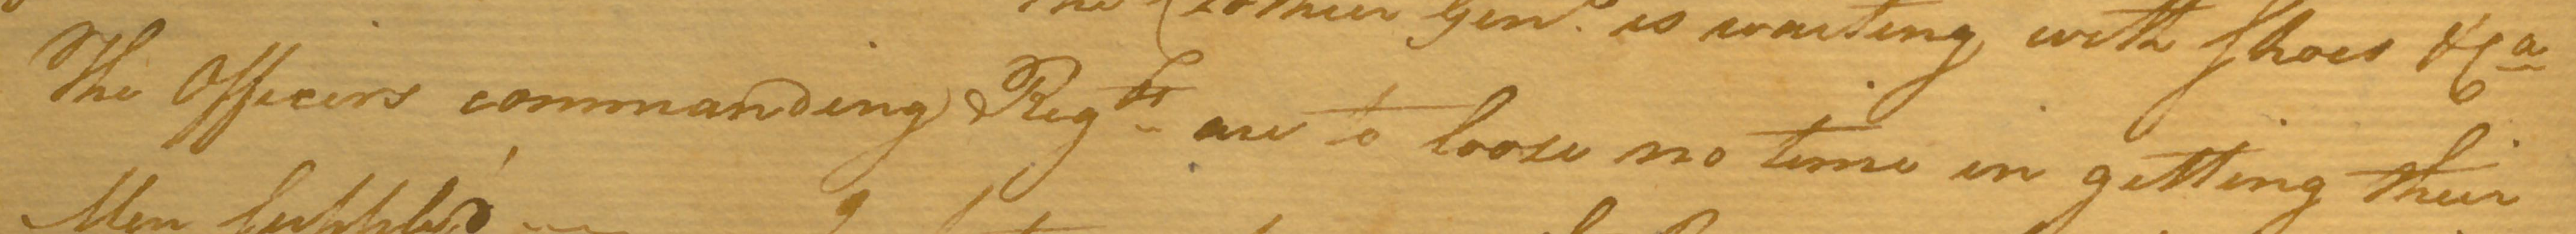The Officers commanding Reg^ts are to loose no time in getting their
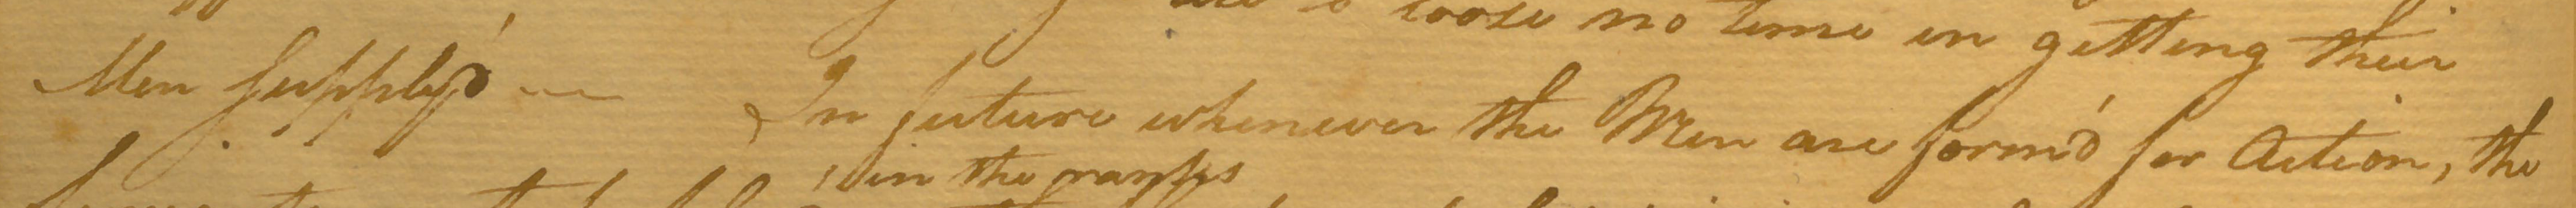Men supply'd- In future whenever the Men are form'd for Action, the
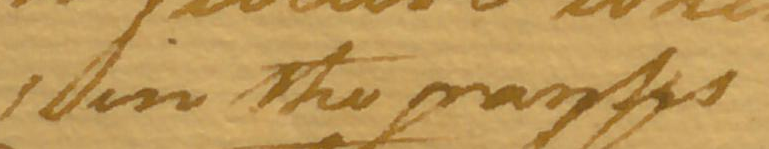in the ranks
